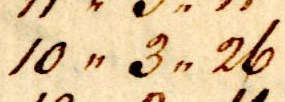10..3..26
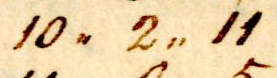10..2..11
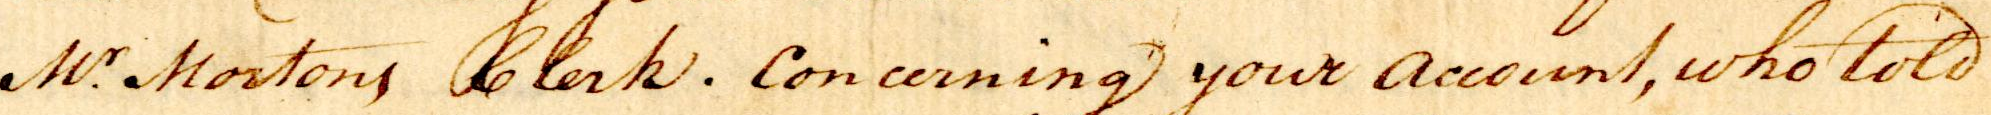M^r Mortons Clerk. Concerning your Account, who told
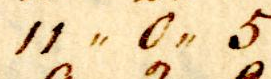11..0..5
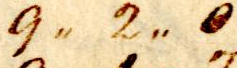9..2..0
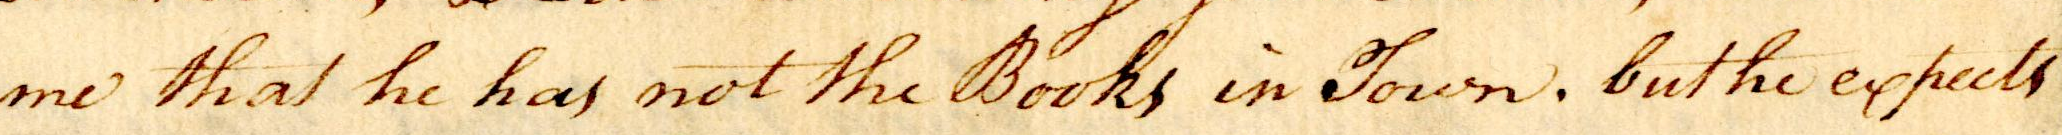me that he has not the Books in Town. but he expects
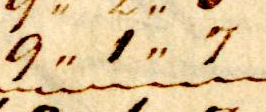9..1..7
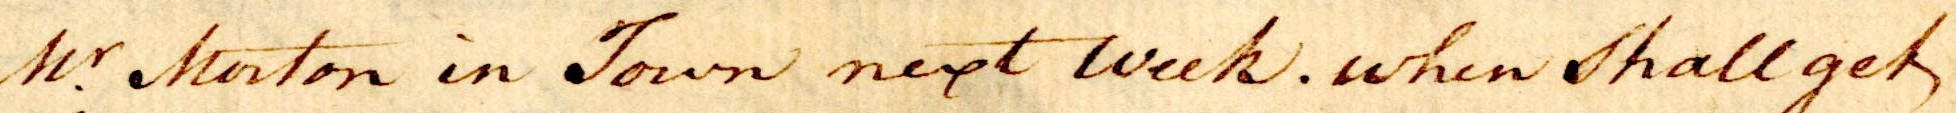M^r Morton in Town next Week. when shall get
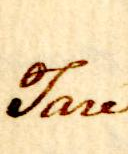Tax
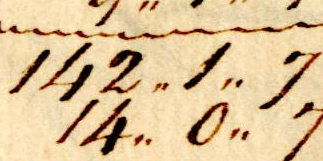142..1..7
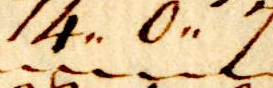14..0..7
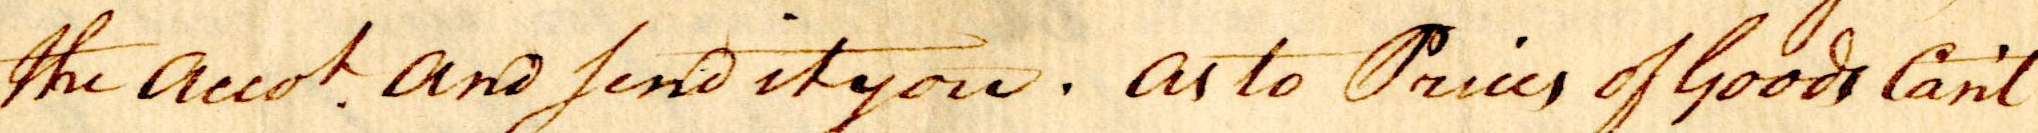the Acco^t, and send it you. As to Prices of Goods Can't
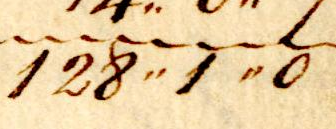128..1..0
